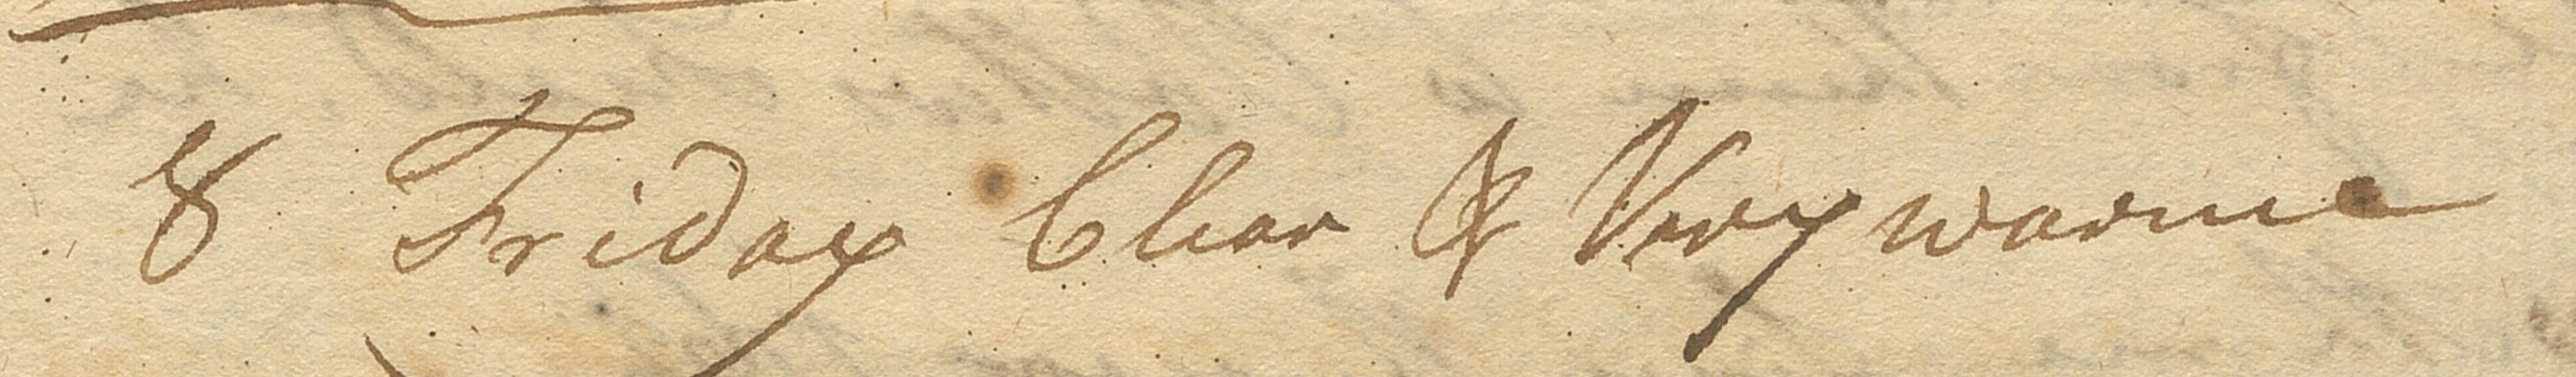8 Friday Clear & Very warme
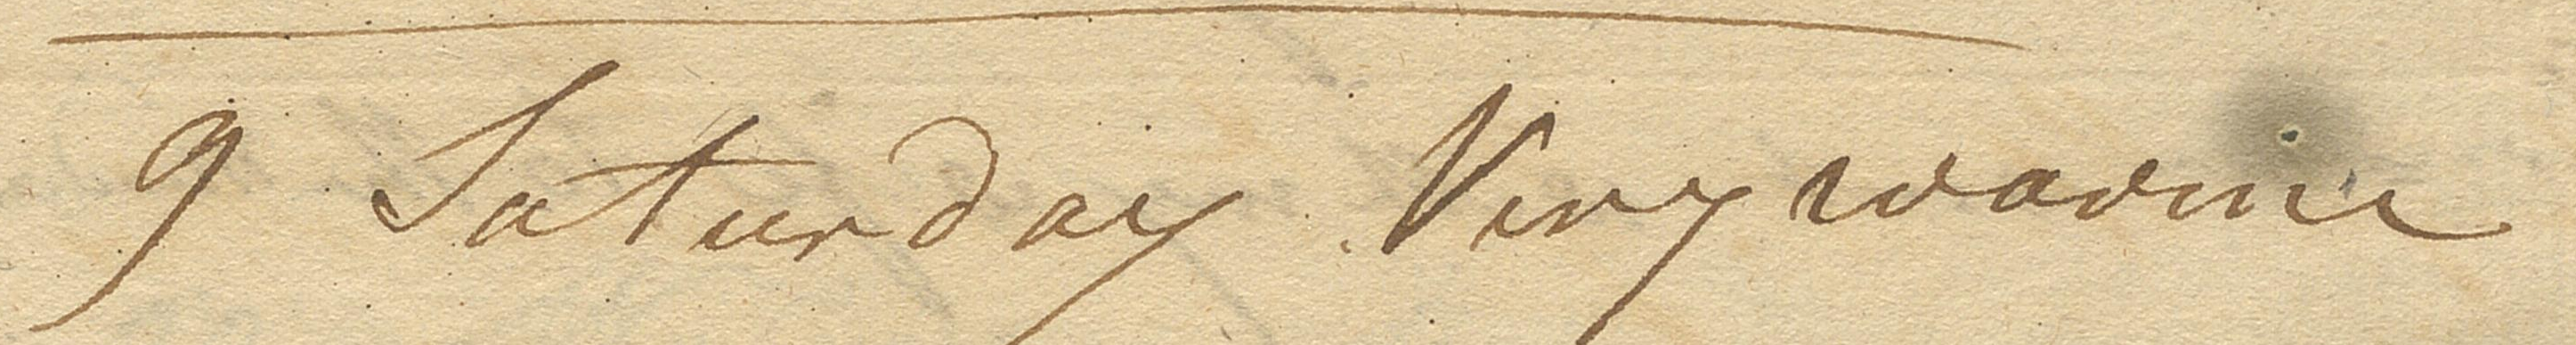9 Saturday Very warme
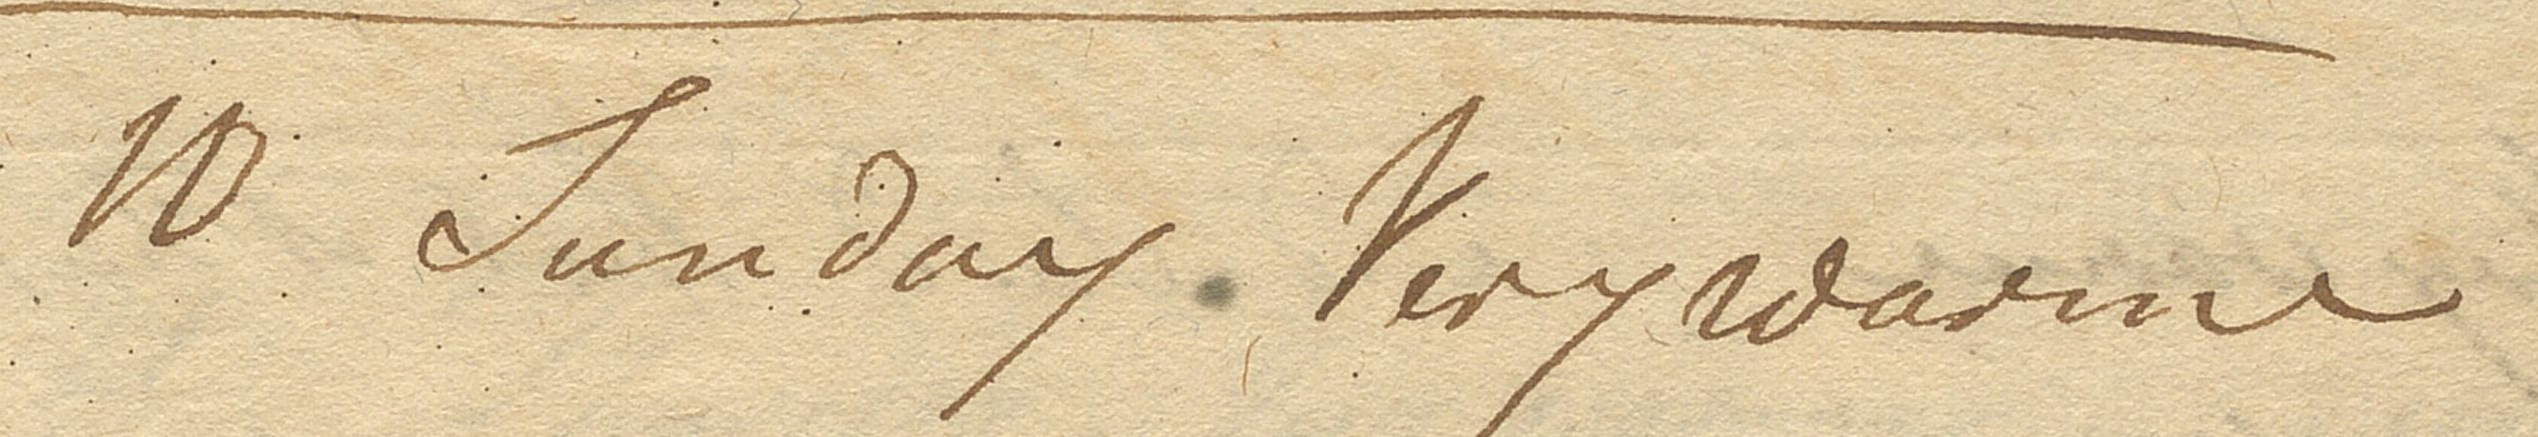10 Sunday. Very warme
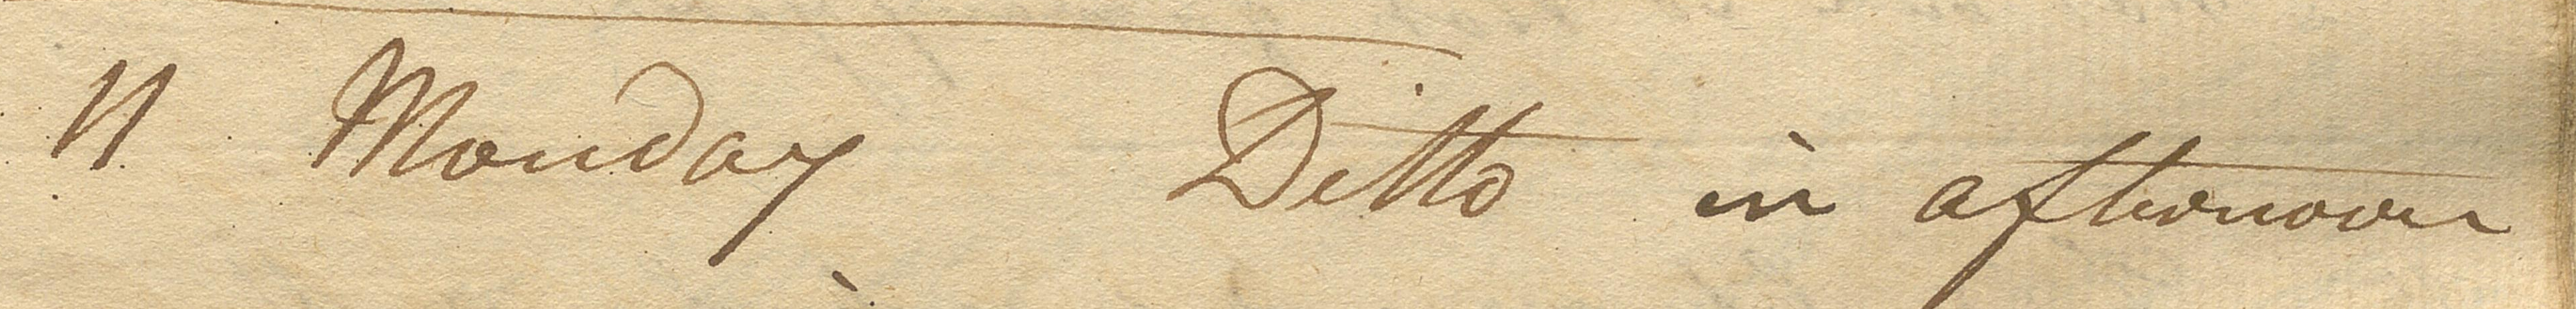11 Monday Ditto in afternoon
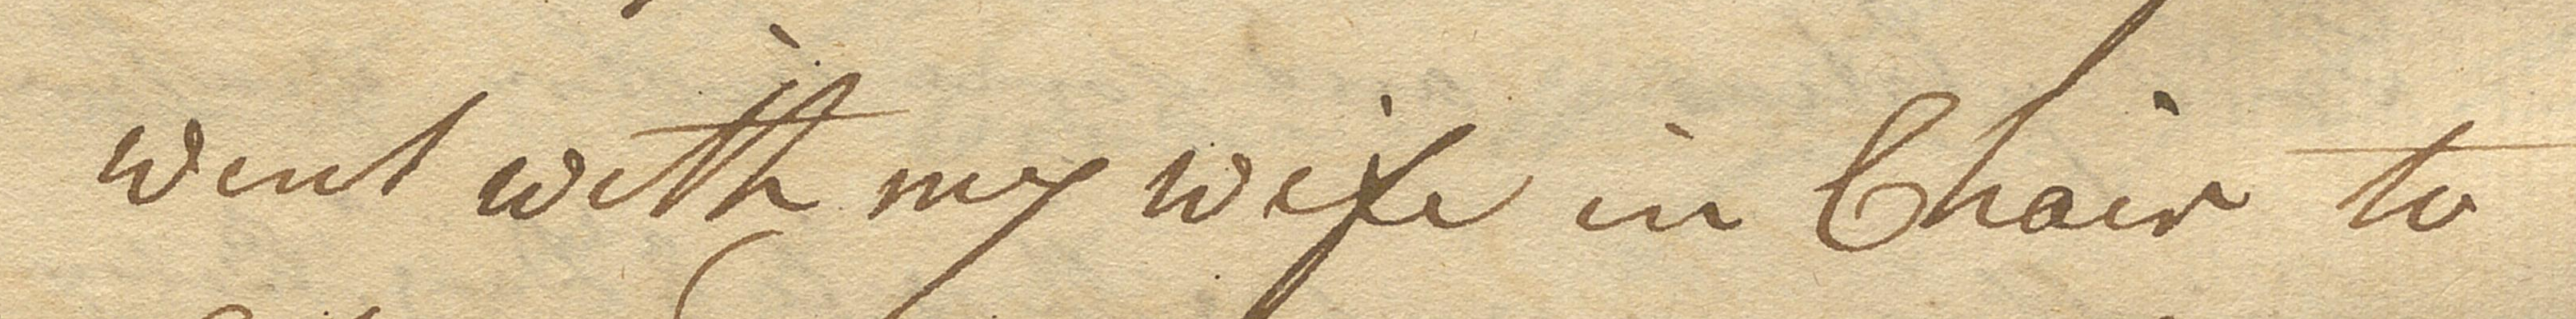went with my wife in Chair to
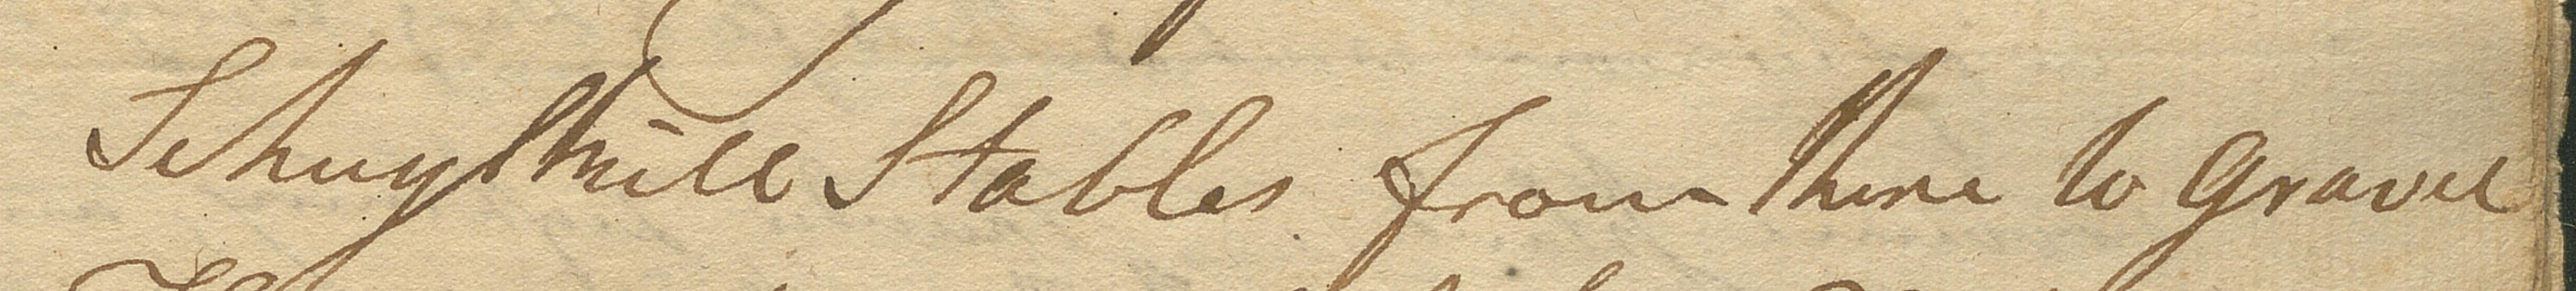Schuykkill Stables from there to gravel
